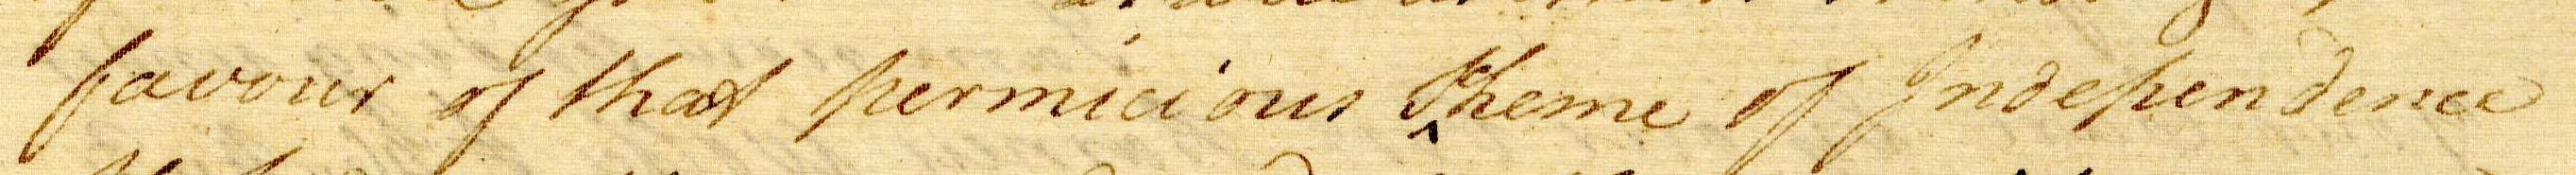favour of that permicious S^cheme of Independence
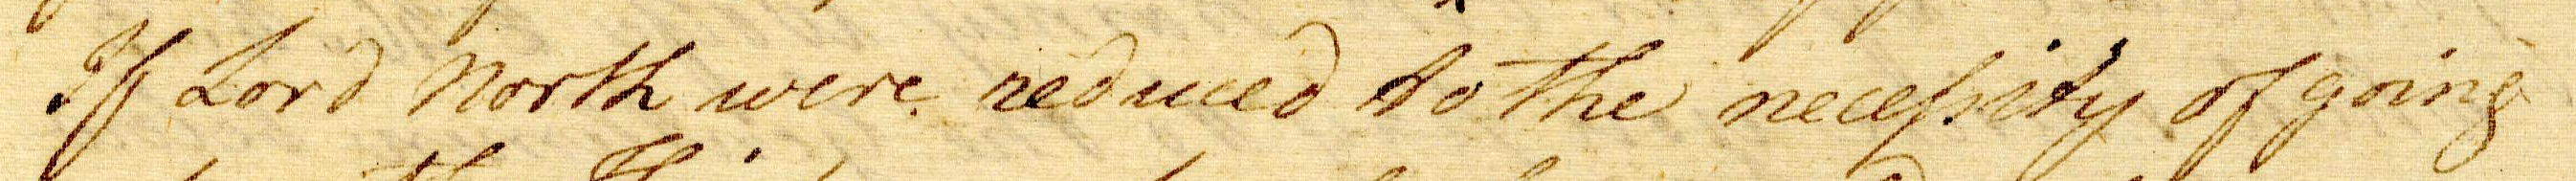If Lord North were reduced to the necessity of going
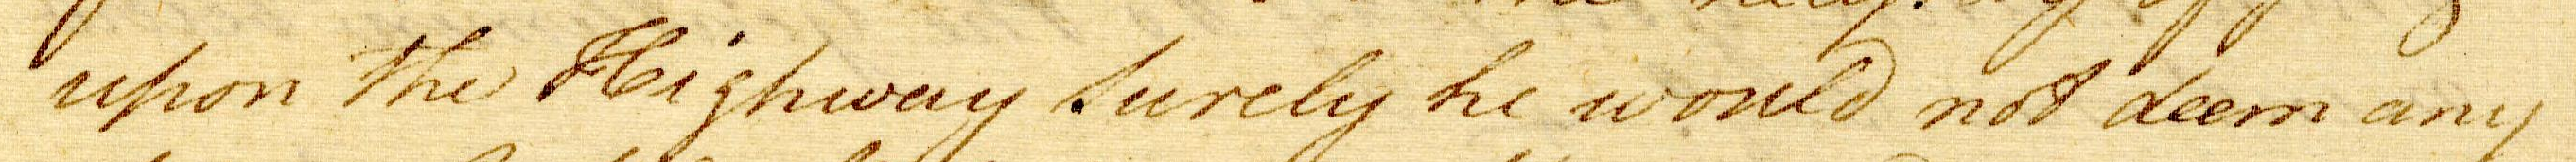upon the Highway surely he would not deem any
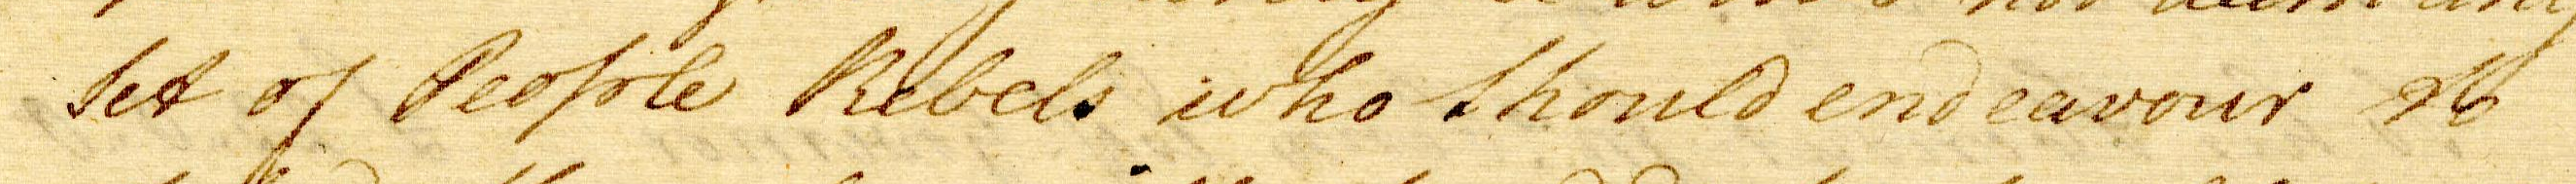set of People Rebels who should endeavour to
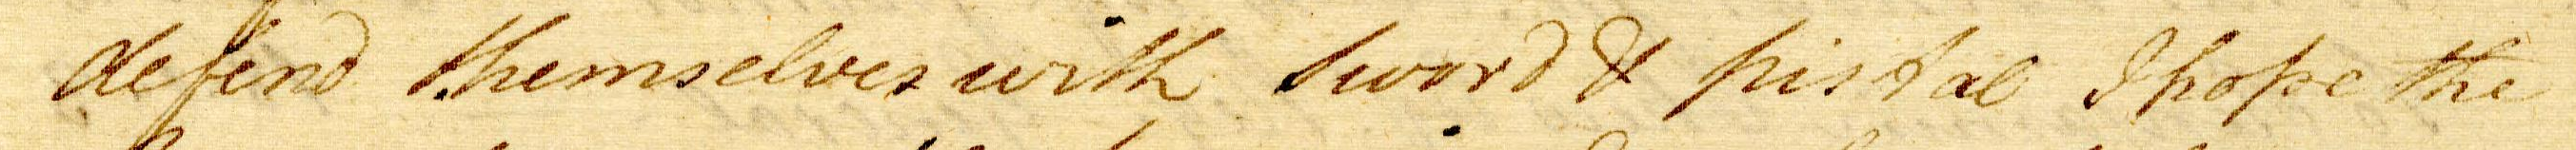defend themselves with sword & pistal I hope the
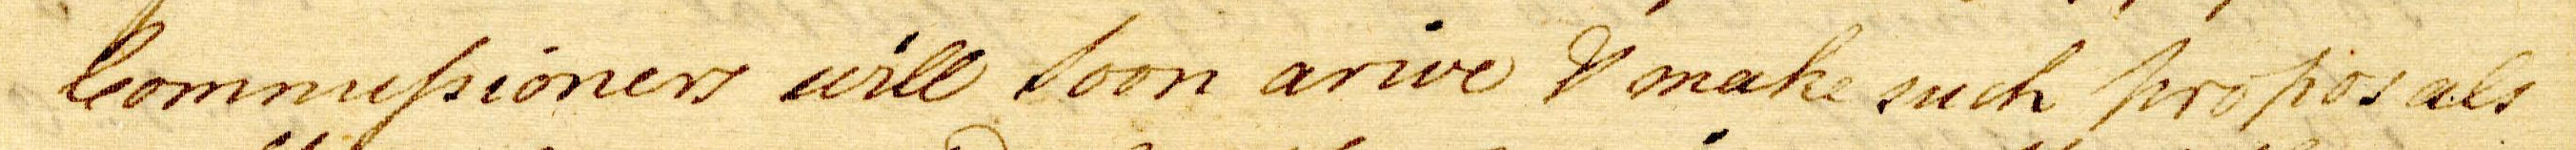Commissioners will soon arive & make such proposals
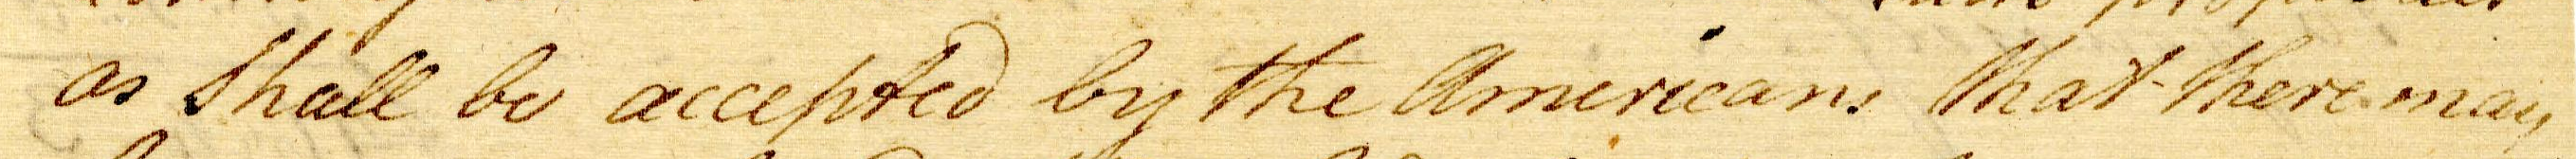as shall be accepted by the Americans that there may
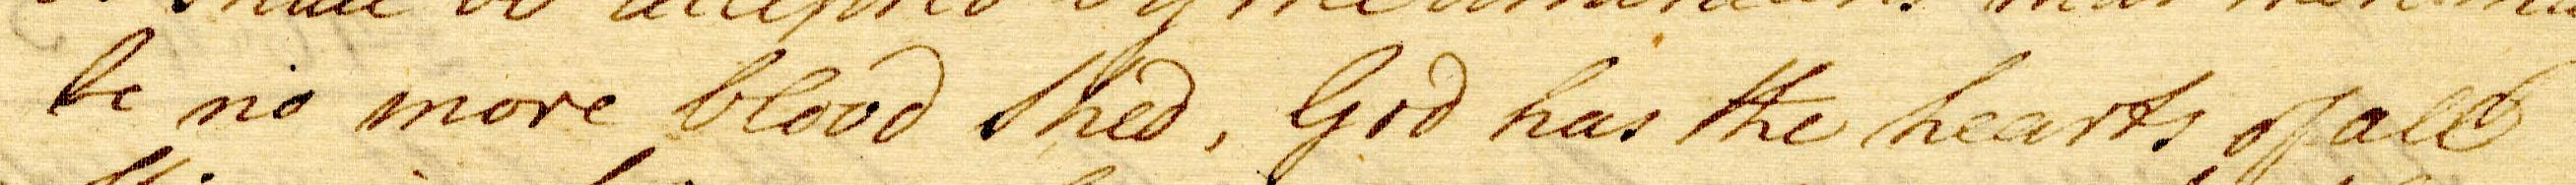be no more blood shed, God has the hearts of all
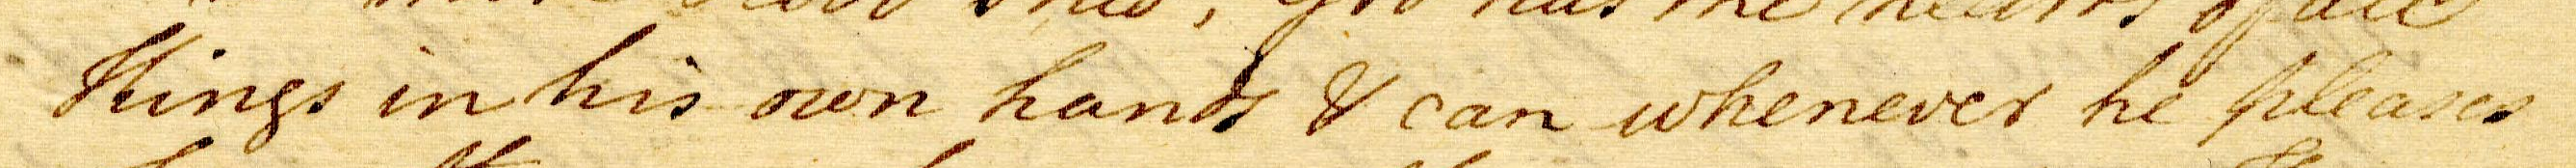Kings in his own hands & can whenever he pleases
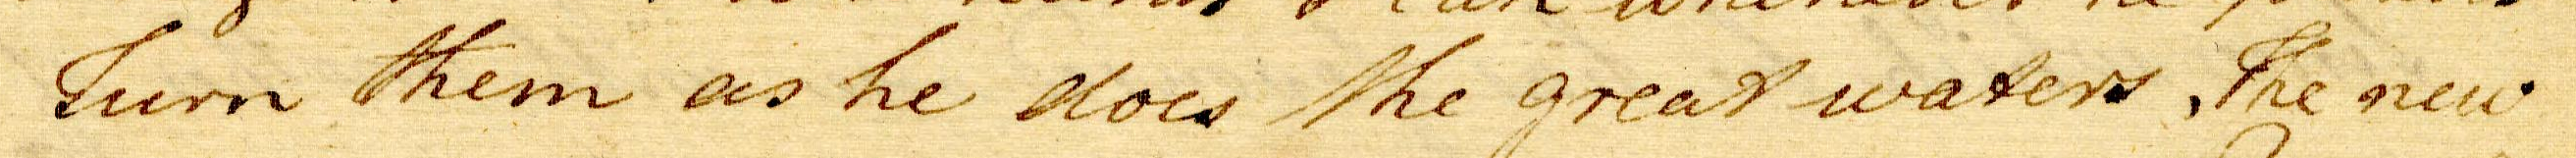turn them as he does the great waters, The new
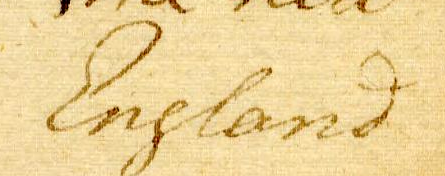England
